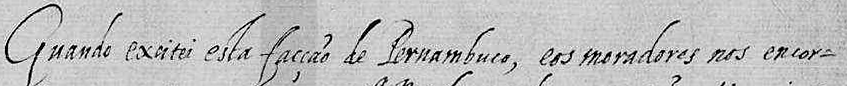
Quando excitei esta facçaõ de Pernambuco, e os moradores nos encor
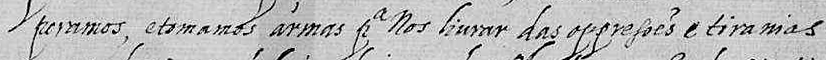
poramos, e tomamos armas p.a nos liurar das oppresoẽs, e tiranias
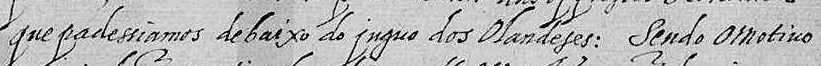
que padessiamos debaixo do juguo dos Olandeses: Sendo o motiuo
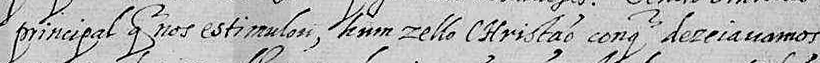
principal q̄ nos estimulou, hum zello CHristão con q̄ dezeiauamos
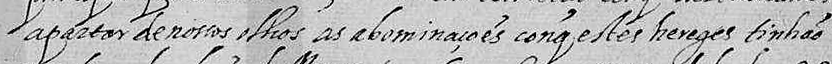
apartar de nossos olhos as abominaçoẽs con q̄ estes hereges tinhaõ
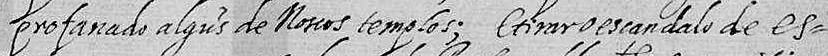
profanado algūs de Nossos templos; E tirar o escandalo de Es
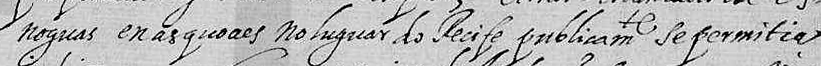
noguas en as quoaes no luguar do Recife publicamte se permitia
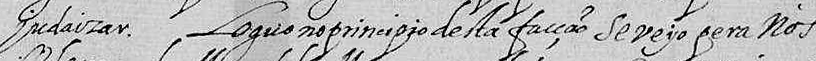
judaizar. Loguo no principio desta facçaõ se veio pera nos
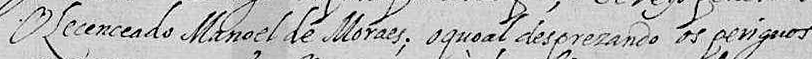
O Lecenceado Manoel de Moraes; o quoal desprezando os periguos
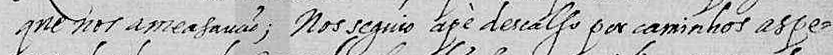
que nos ameasauaõ; nos seguio a pè descalso por caminhos aspe
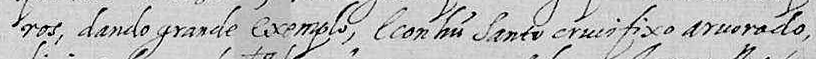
ros, dando grande exemplo, E con hū Santo crucifixo aruorado,
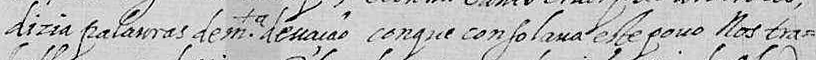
dizia palauras de m.ta deuação, con que consolaua este pouo Nos tra
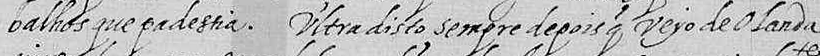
balhos que padessia. Vltra disto sempre depois q̄ veyo de Olanda
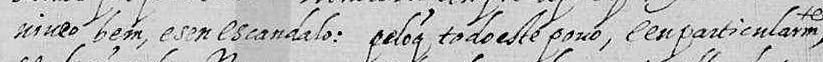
uiueo bem, e sen escandalo: pelo q̄ todo este pouo, e eu particularmte,
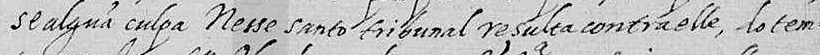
se alguā culpa Nesse santo tribunal resulta contra elle, do tem
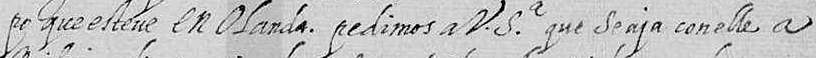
po que esteue en Olanda. pedimos a V. S.a que se aja con elle a
